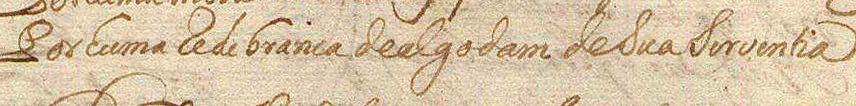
Por huma Rede branca de algodam de Sua Serventia
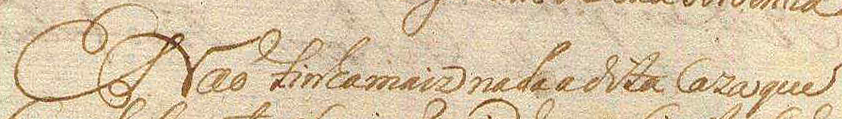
E Naõ tinha maiz nada a dita Caza que
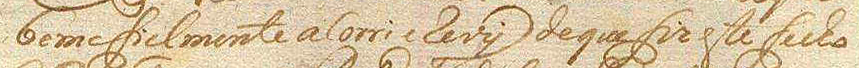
bem e fielmente a Corri e Revy de que fiz este fecho
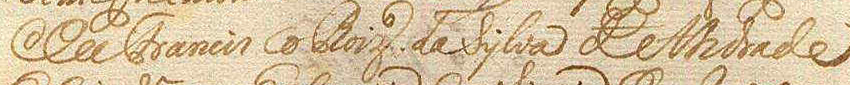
E Eu Francisco Roiz̄ da Sylva d̄ Andrade
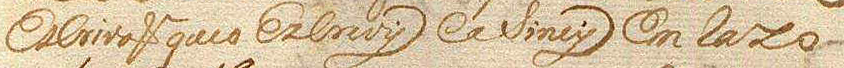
EsCrivaõ que o Ezcrevy E aSiney Em Razo
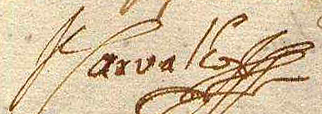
Je Carvalho
